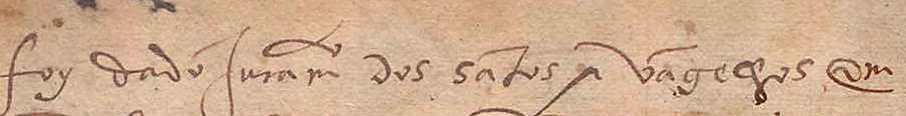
foy dado Juramto dos sātos evāgelhos em
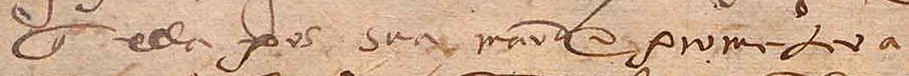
q̅ ella pos sua mão e prometeo a
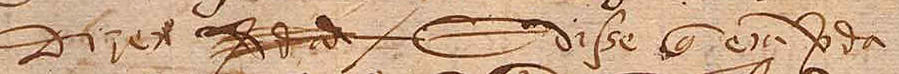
dizer ꝟdade / E disse q̄ era ꝟda
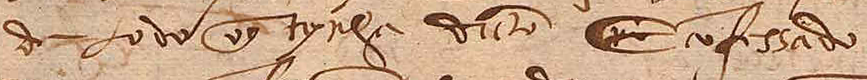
de todo o q̄ tynha dicto E cōfessado
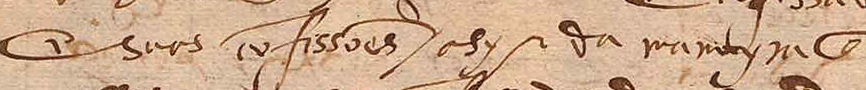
ē suas cōfissões / asy e da maneyra q̄
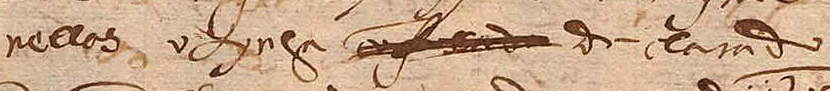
nellas o tynha cōfessado declarado
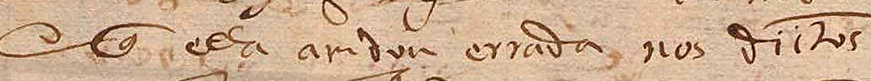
e q̄ ella amdou errada nos dictos
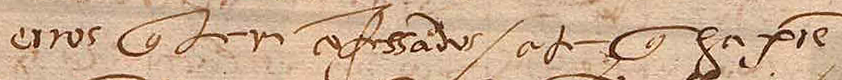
erros q̄ tem cōfessados / ate q̄ ha prē
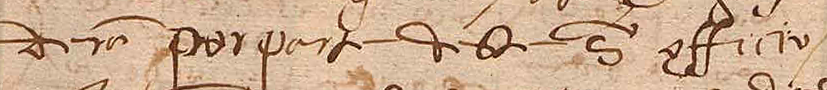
derā por parte deste Sto officio /
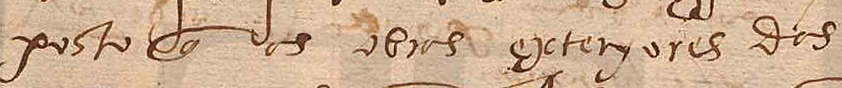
posto q̄ as obras exteryores das
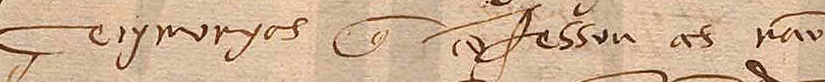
Cerymonyas q̄ cōfessou as não
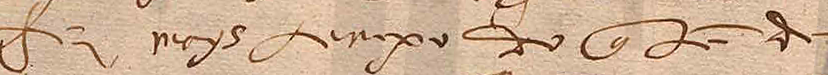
fez mays tempo do q̄ tē de
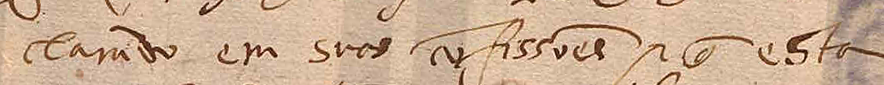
clarado em suas c̄ofissões e q̄ esta
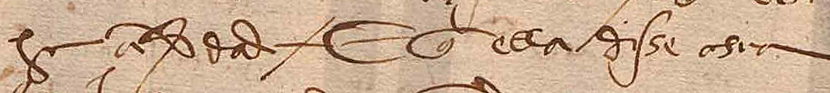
he a ꝟdade / E q̄ ella disse a sua
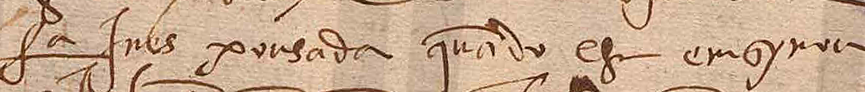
fa Jnes pousada qūado lhe emsynou
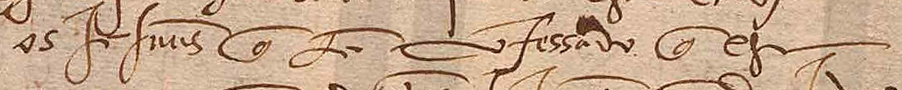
os JeJūus q̄ tē Cōfessado q̄ lhe
